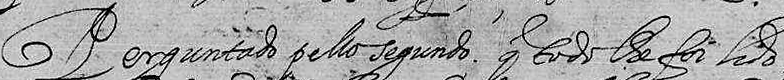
Perguntado pello segundo q̄ todo lhe foi lido
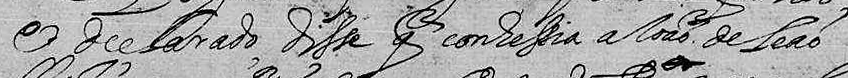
& declarado, disse q̄ conhessia a Ioaõ de Leaõ
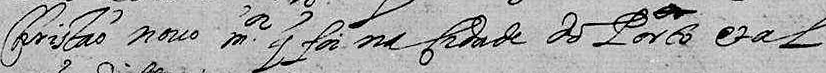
Christaõ nouo mor. q̄ foi na Cidade do Porto & aL
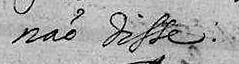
naõ disse.
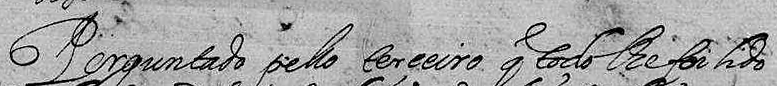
Perguntado pello terceiro q̄ todo lhe foi lido
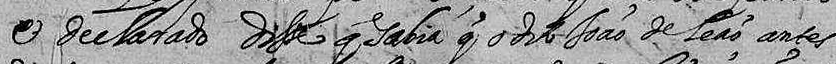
& declarado disse q̄ sabia q̄ o dito Ioão de Leaõ antes
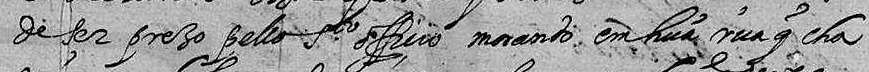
de ser prezo pello s.to officio morando em huā rua q̄ cha
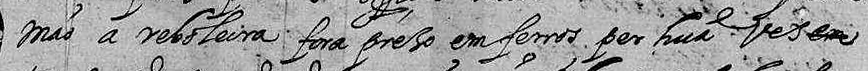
maõ a reboleira fora prezo em ferros per huā ves em
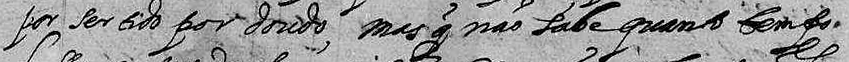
por ser tido por doudo, mas q̄ naõ sabe quanto tempo
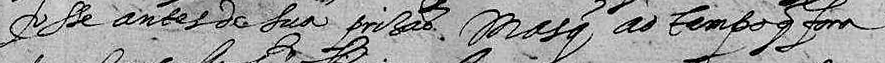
fosse antes de sua prizaõ. Mas q̄ ao tempo q̄ fora
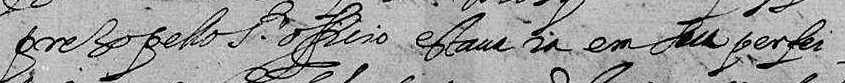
prezo pello s.to officio estaua ia em seu perfei
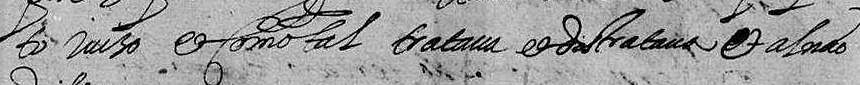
to iuizo & Como tal trataua & destrataua & al não
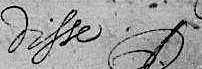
disse
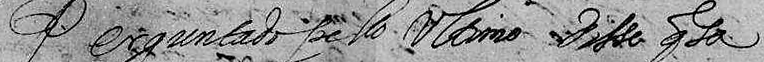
Perguntado pello Vltimo disse q̄ sa
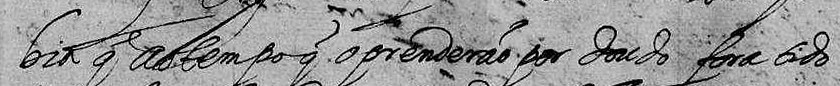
bia q̄ ao tempo q̄ o prenderaõ por doudo fora tido
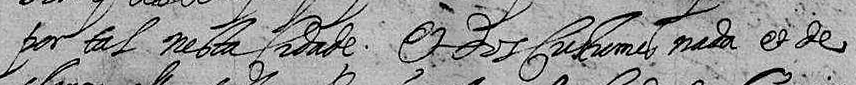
por tal nesta Cidade. & dos Custumes nada & de
